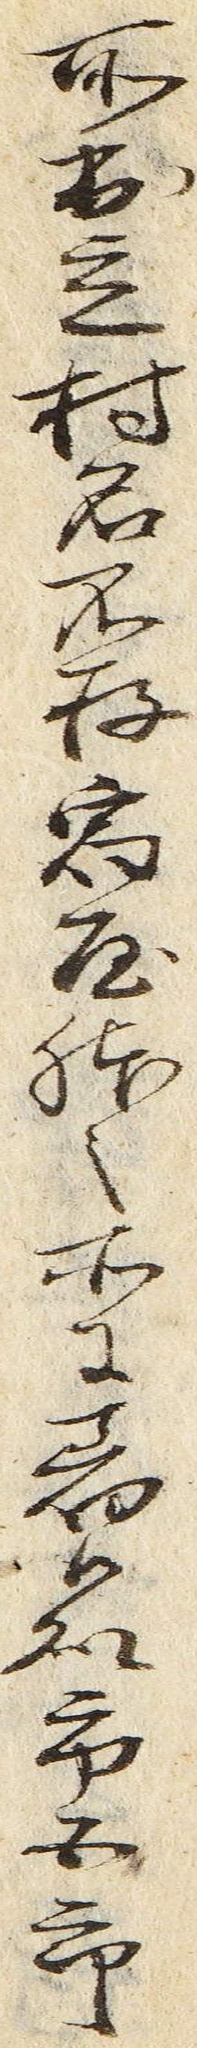所出立村名不存宿屋体之所に着候処市五郎
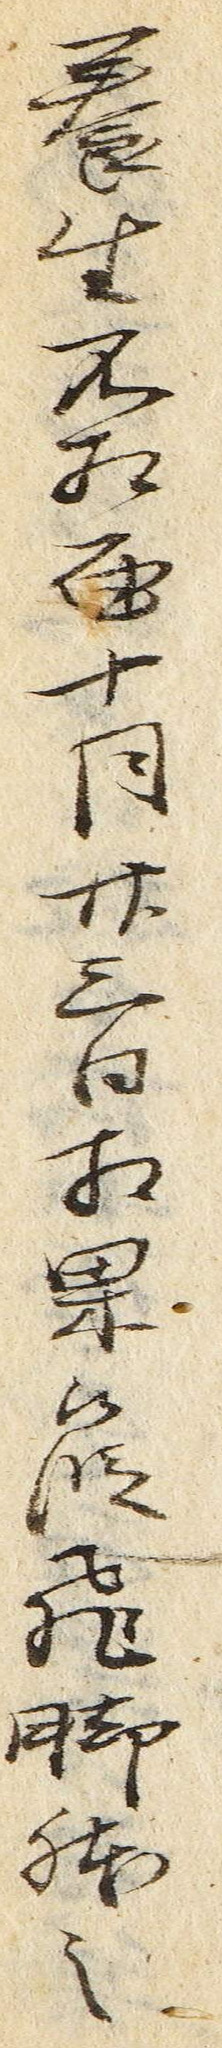養生不相届十月廿三日相果候段飛脚体之

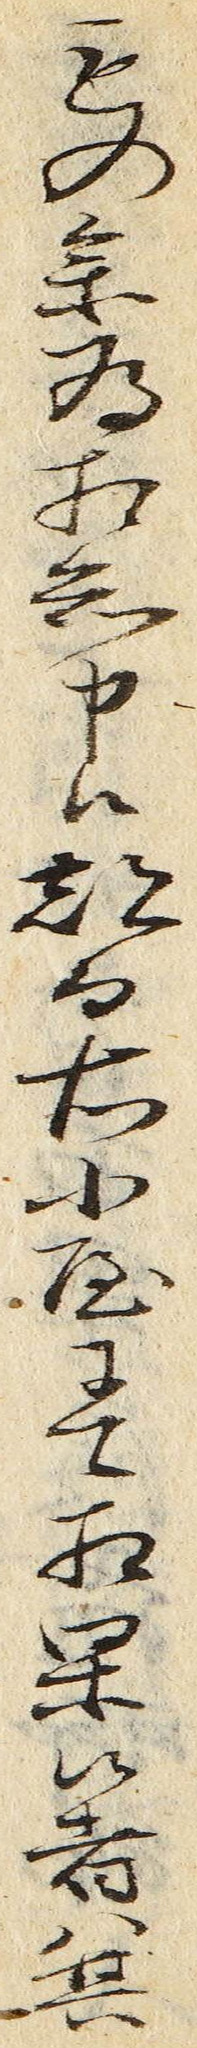もの参為相知申候都て右小屋にて相果候者は其
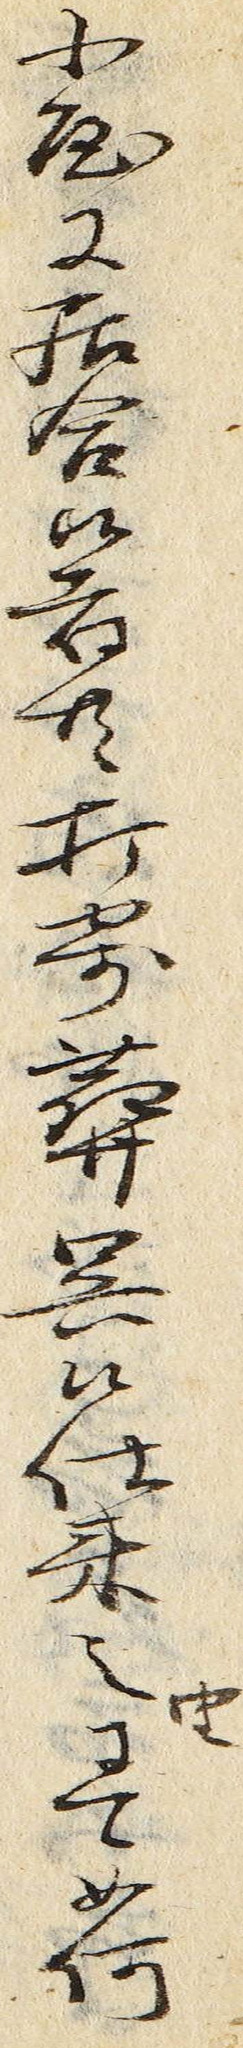小屋に居合候者共打寄葬呉候仕来之由にて如何
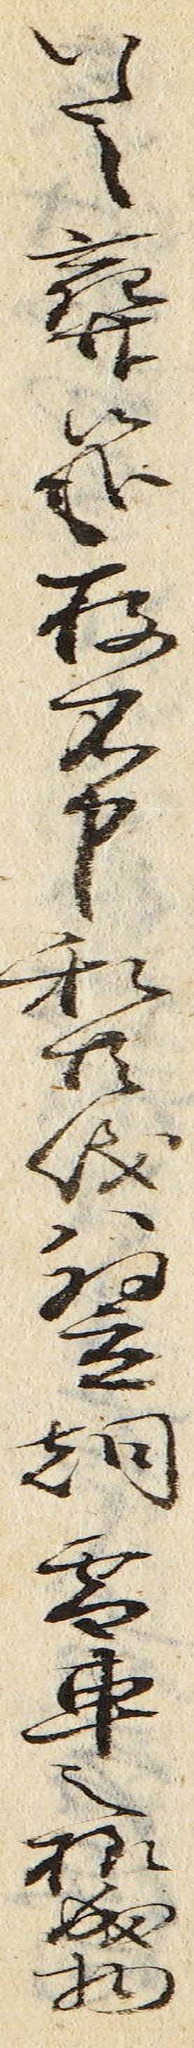いたし葬候哉存不申私共儀は翌朝雪車之様成物
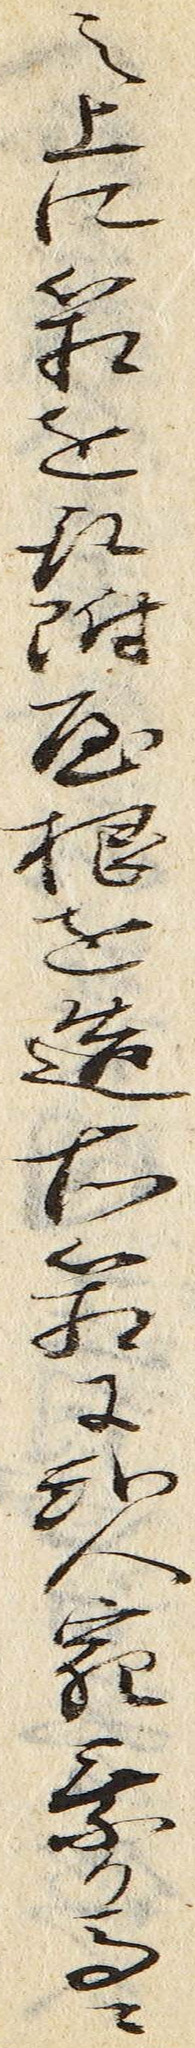之上に箱を取附屋根を造右箱に弐人宛乗り馬に
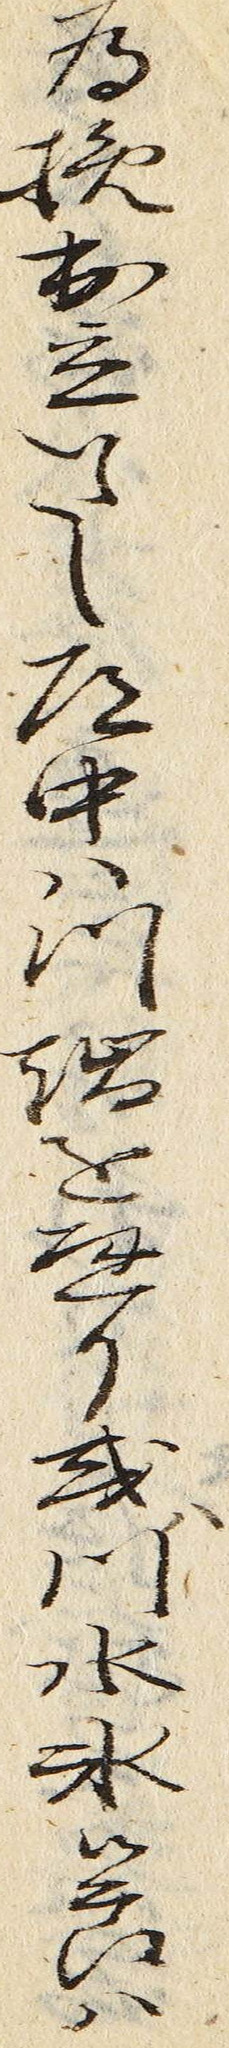為挽出立いたし道中は川端を通り或は川水氷候節は
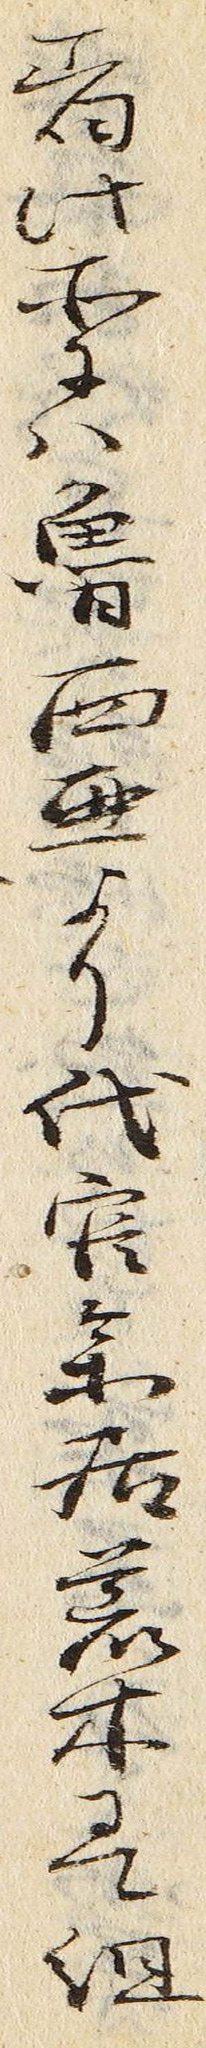着此所には魯西亜より代官参居荒木にて組
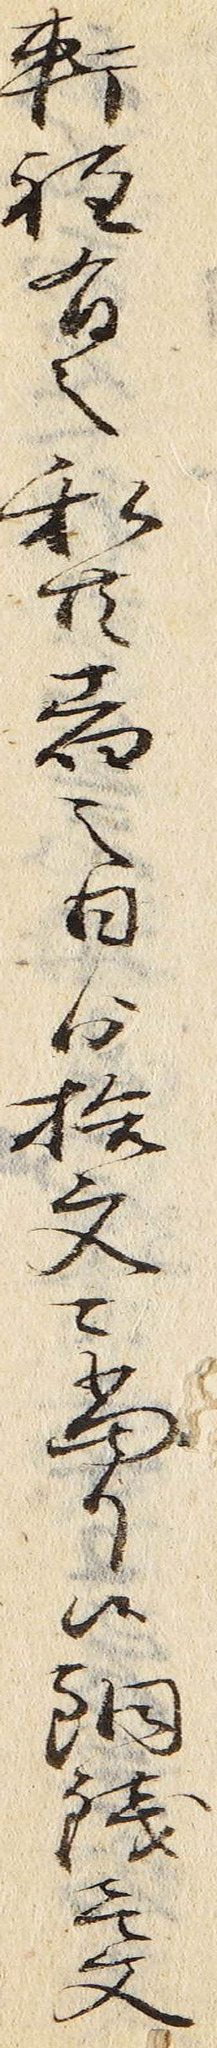軒程有之私共着之日ゟ拾文に当り候銅銭壱文
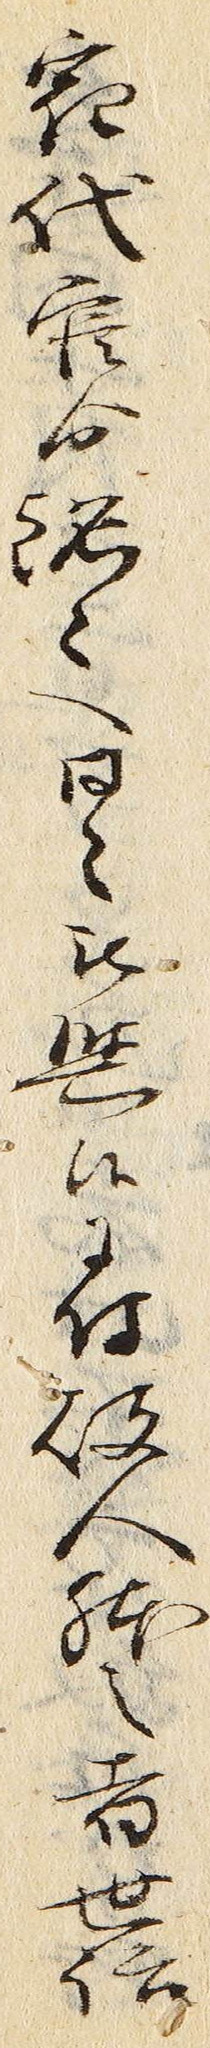宛代官ゟ銘々へ日々被与候に付役人体之者世話
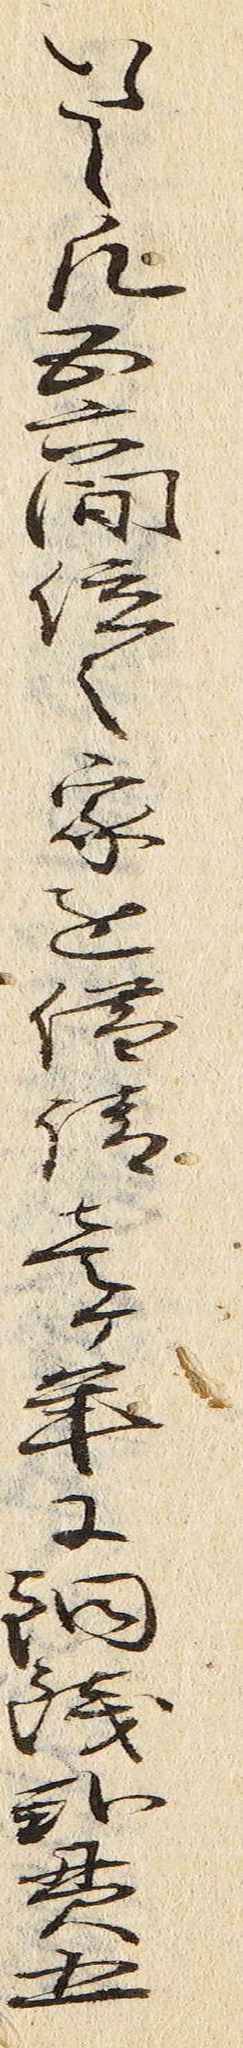いたし凡五六間位之家を借請壱ヶ年に銅銭弐貫五
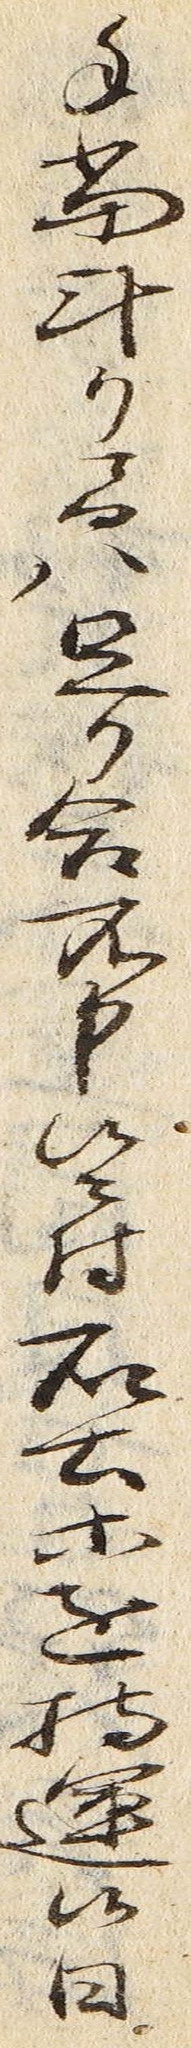手当斗りにては足り合不申候に付石土等を持運候日
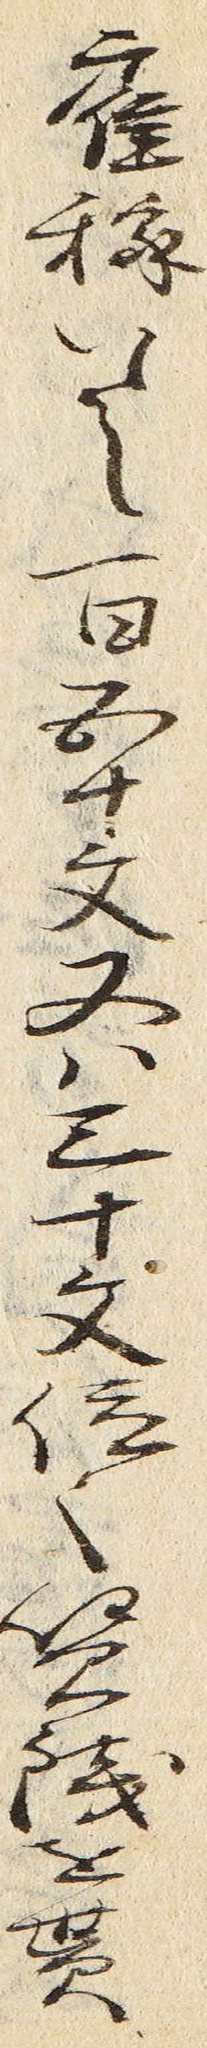雇稼いたし一日五十文又は三十文位之賃銭を貰
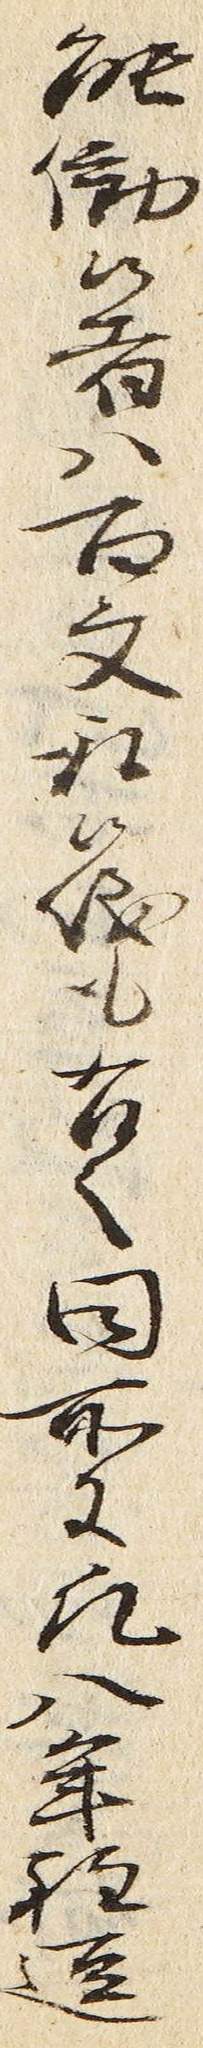能働候者は百文取候儀も有之同所に凡八年程逗
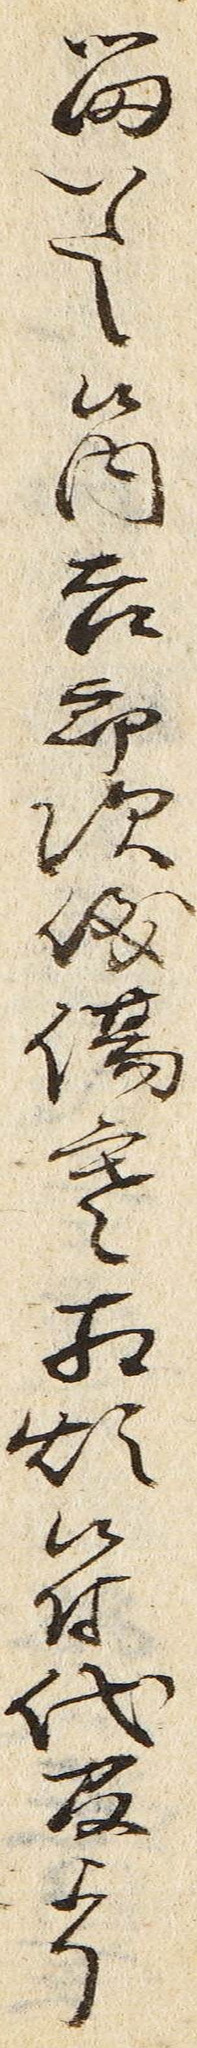留いたし候内吉郎次傷寒相煩候付代官より
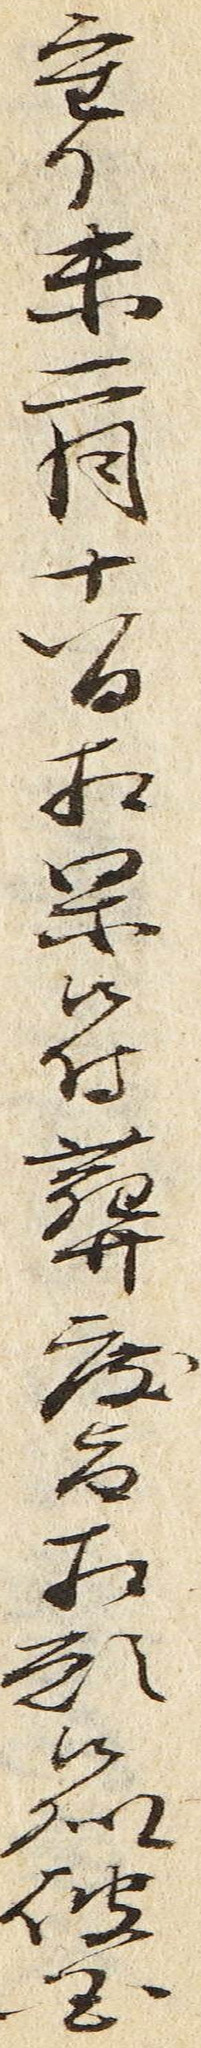重り未二月十八日相果候付葬度旨相願候処彼国
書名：漂民後記
